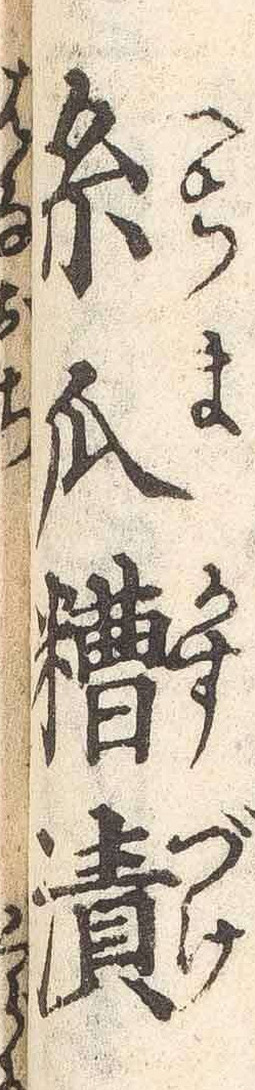糸瓜糟漬
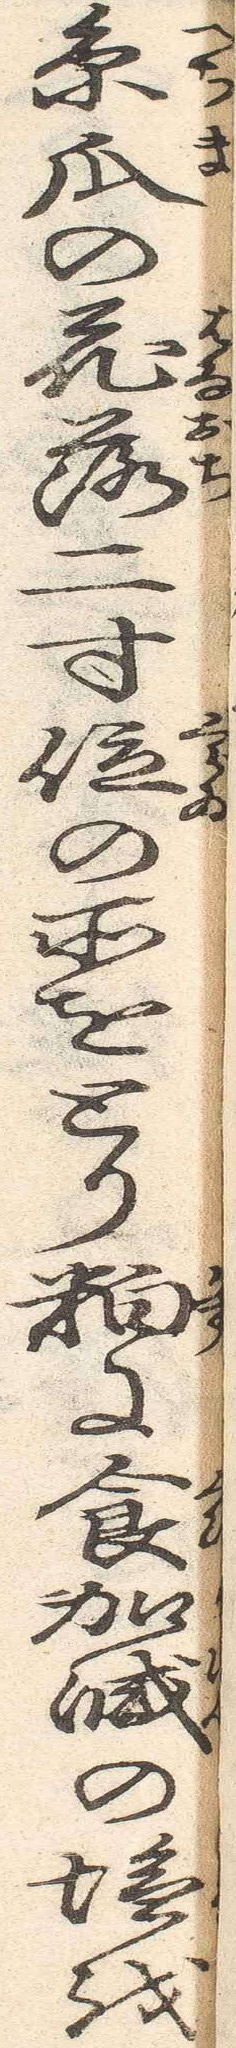糸瓜の花落二寸位の所をとり粕に食加減の塩を
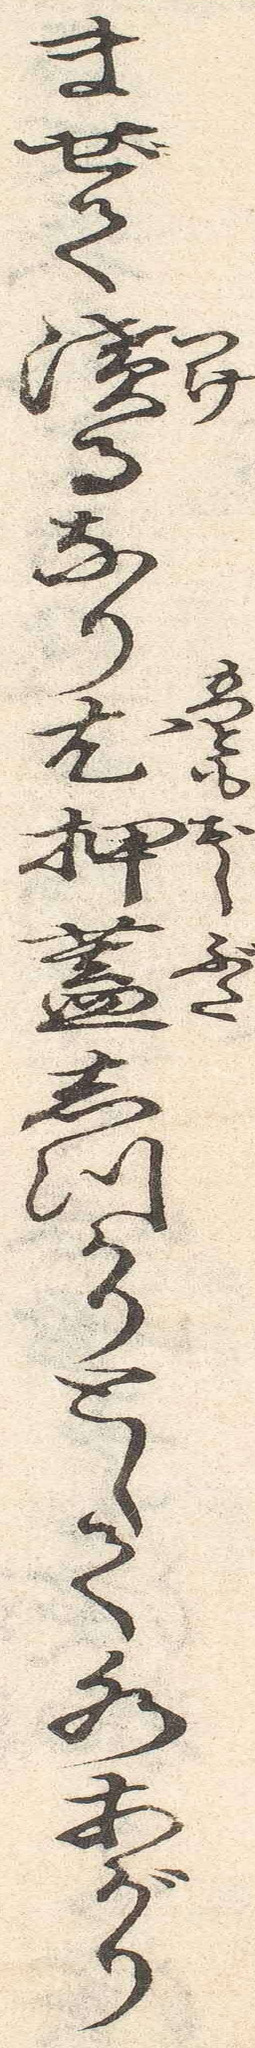まぜて漬るなり尤押蓋しつかりとして水あがり
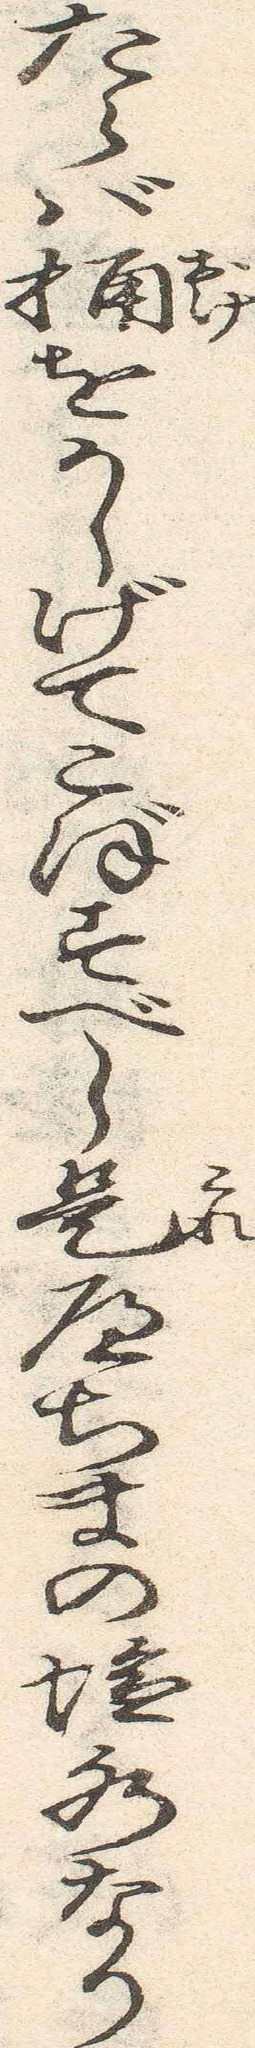たらば桶をかしげてこぼすべし是へちまの塩水なり
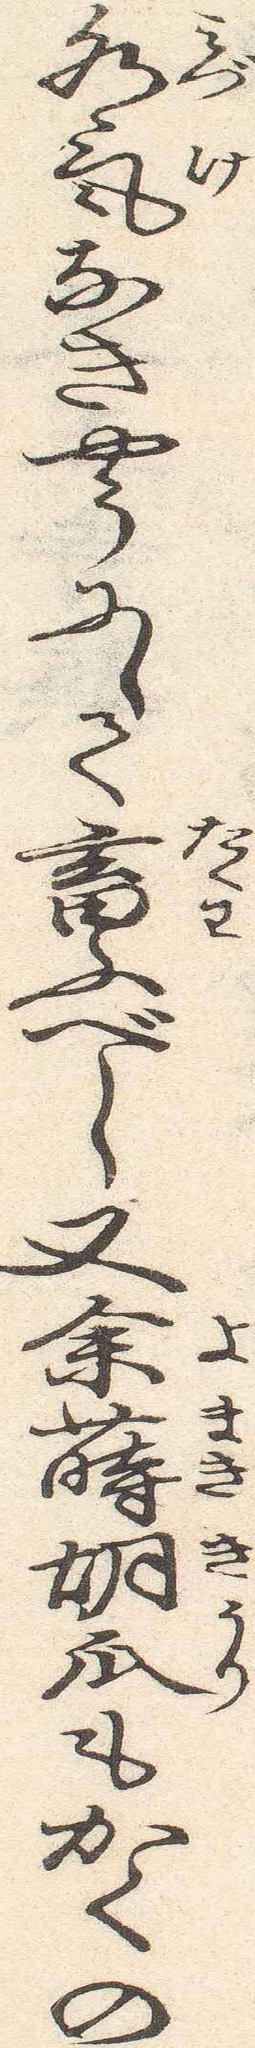水気なきやうにして蓄ふべし又余蒔胡瓜もかくの
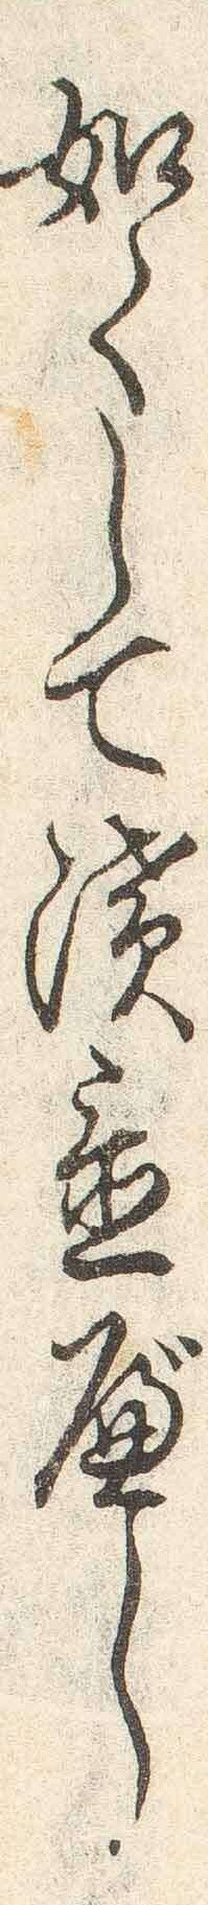如くして漬置べし
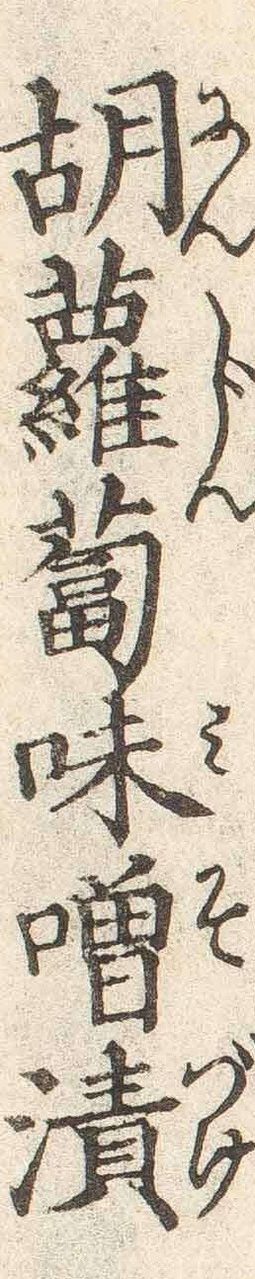胡蘿蔔味噌漬
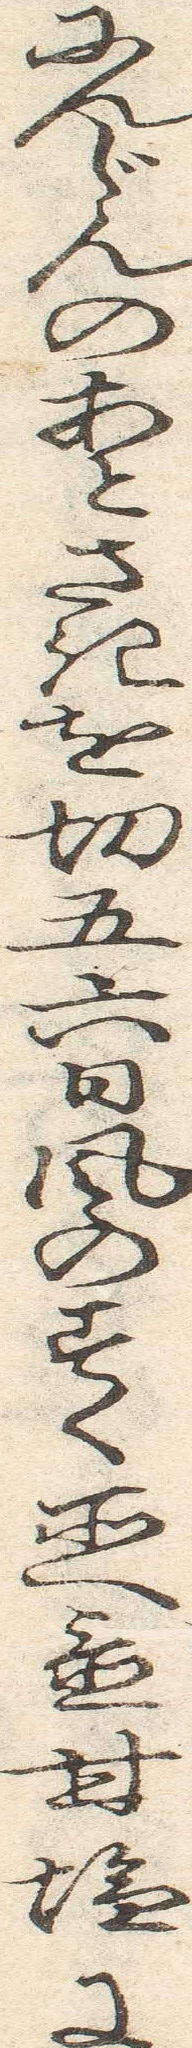にんじんのあとさきを切五六日風のすく所へ置甘塩に
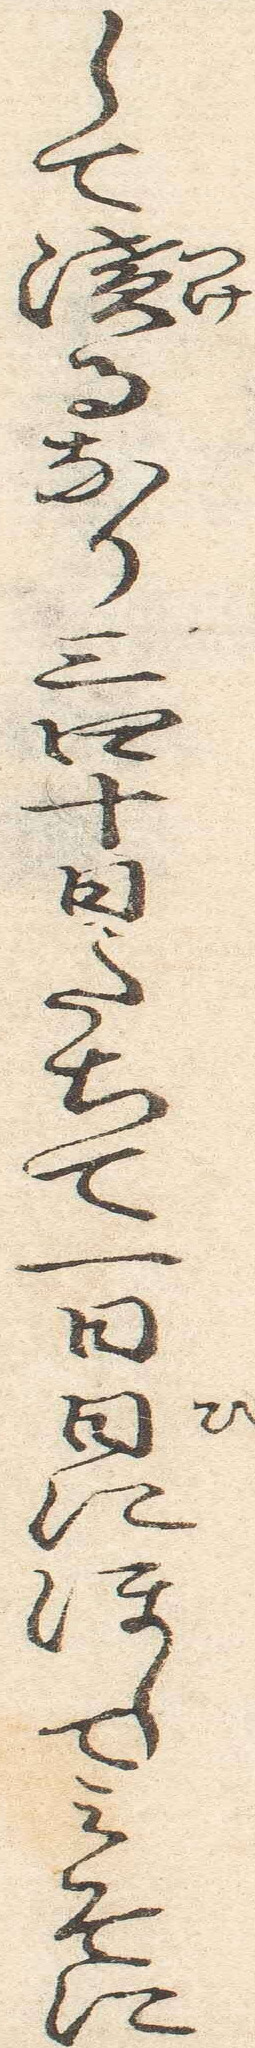して漬るなり三四十日たちて一日日にほしてみそに
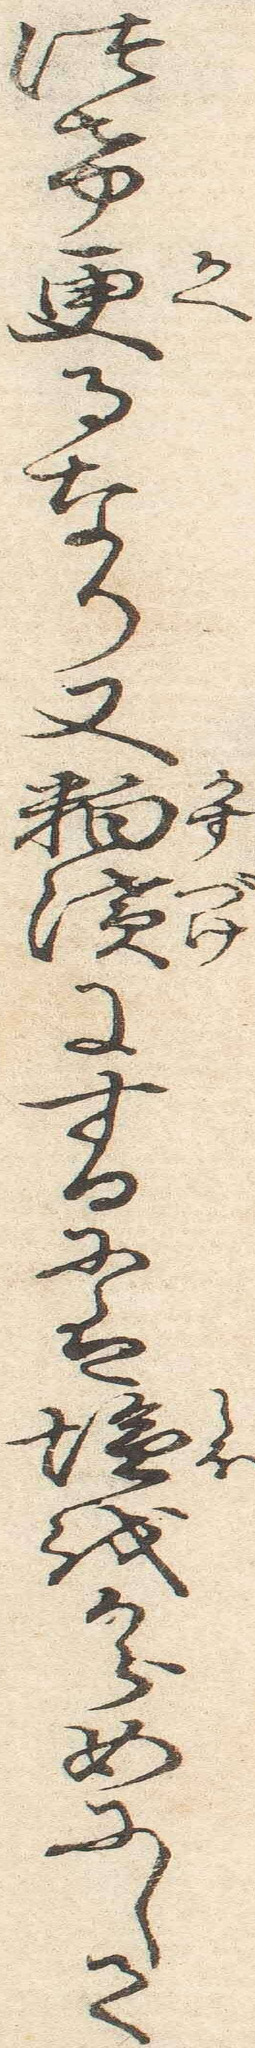つけ更るなり又粕漬にするには塩をからめにして

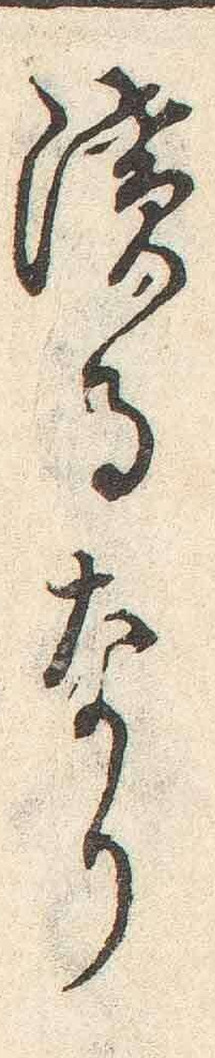漬るなり
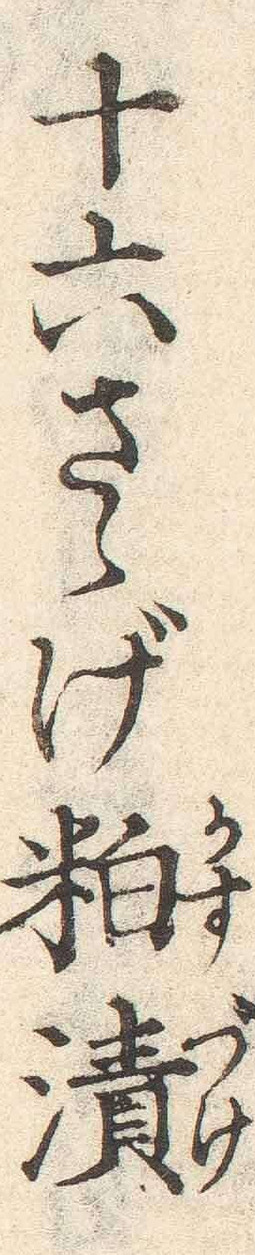十六さゝげ粕漬
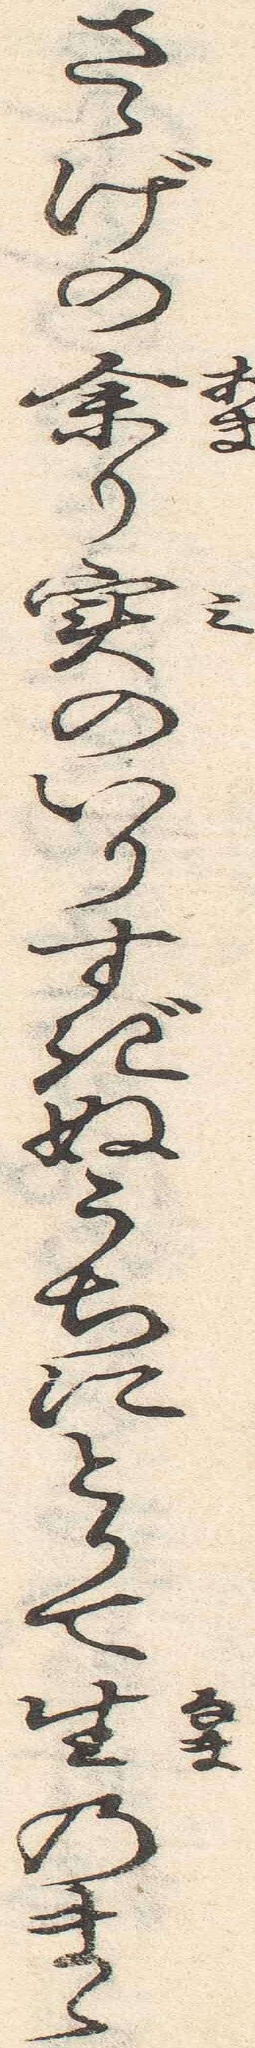さゝげの余りの実のいりすぎぬうちにとりて生のまゝ
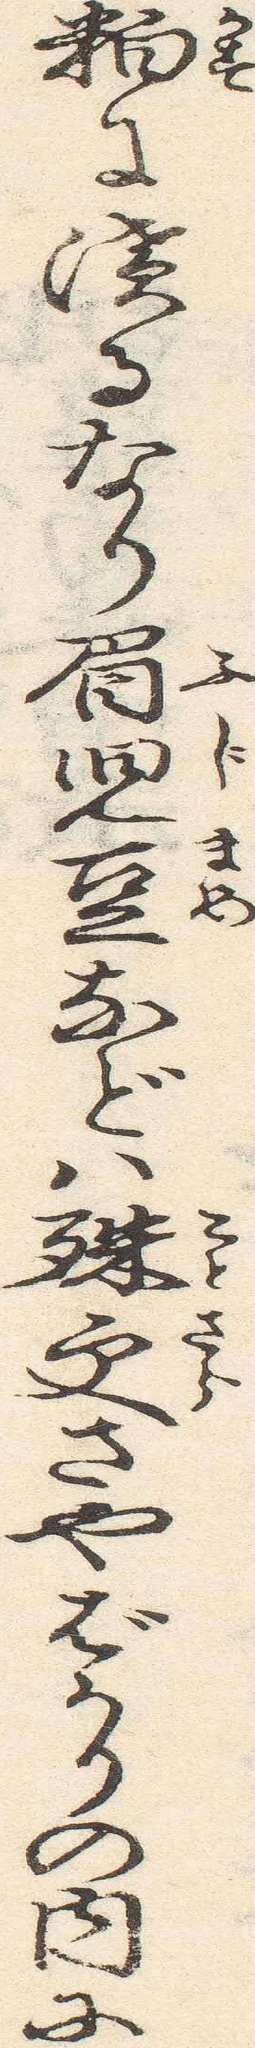粕に漬るなり眉児豆などは殊更さやばかりの内に
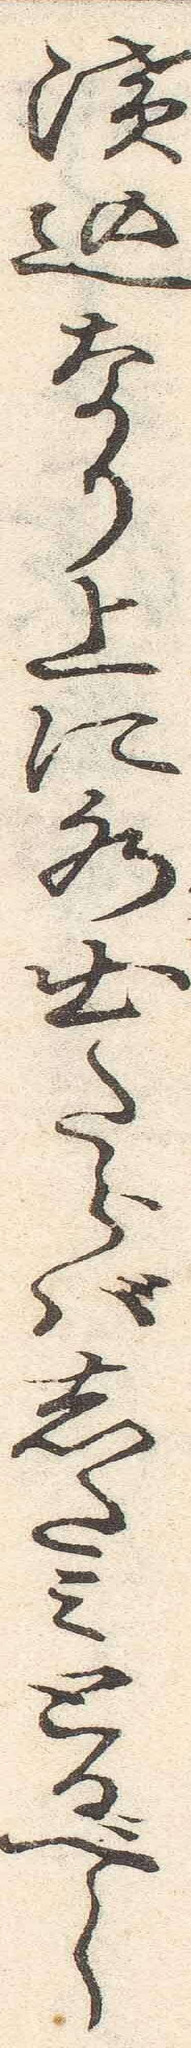漬込なり上に水出たらばしたみとるべし
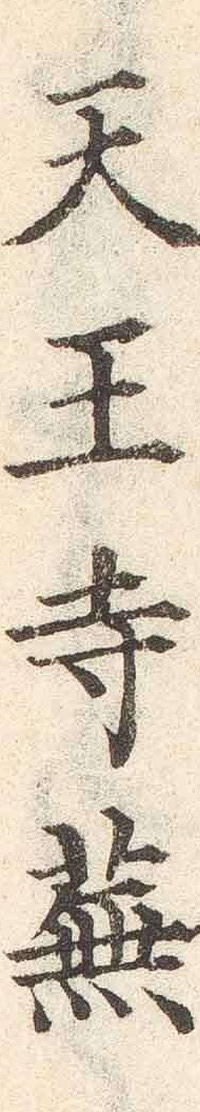天王寺蕪
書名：四季漬物塩嘉言
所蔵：東京学芸大学附属図書館 国文学研究資料館
